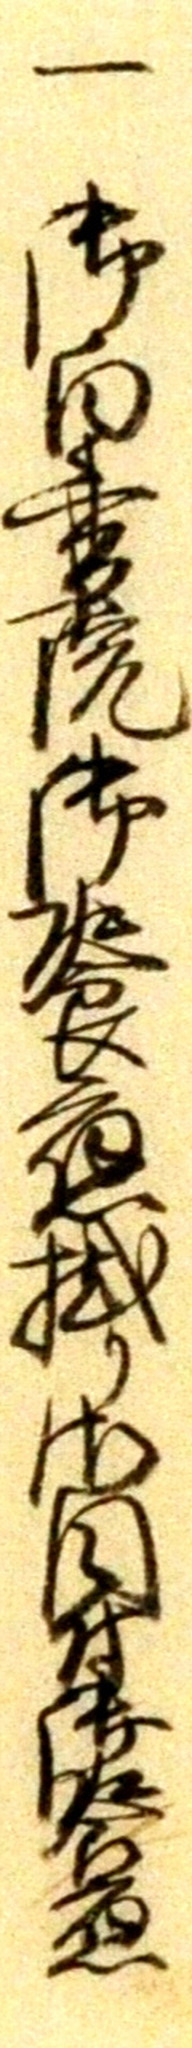一御白書院御饗応掛り御目付御饗応
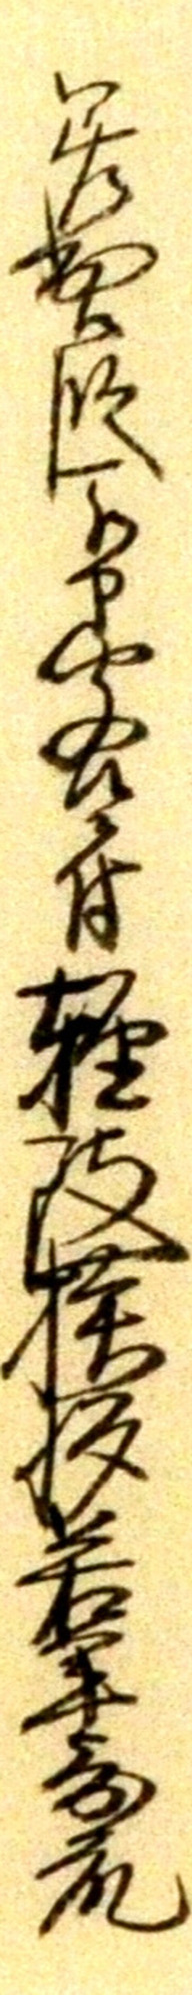差出候段被申聞候ニ付軽致挨拶若年寄衆
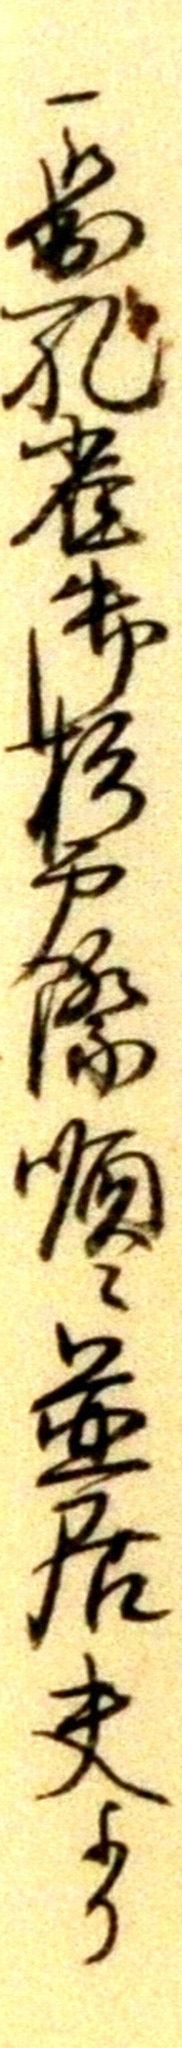被出孔雀之御杉戸際順ニ並居夫より

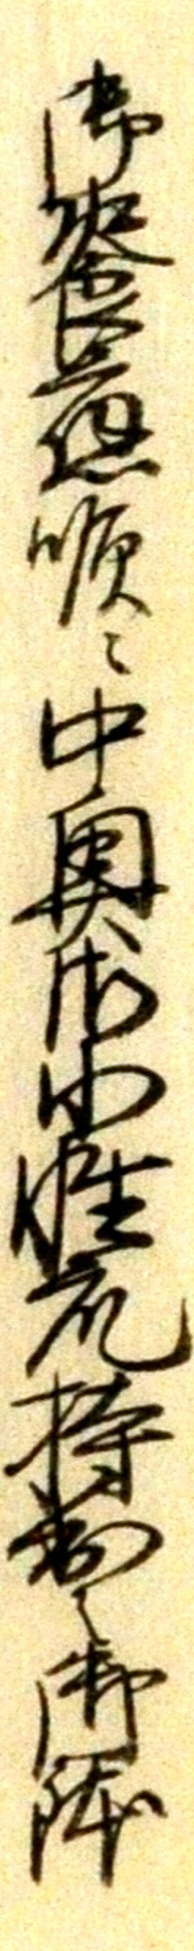御饗応順ニ中奥御小性衆持出之御鉢
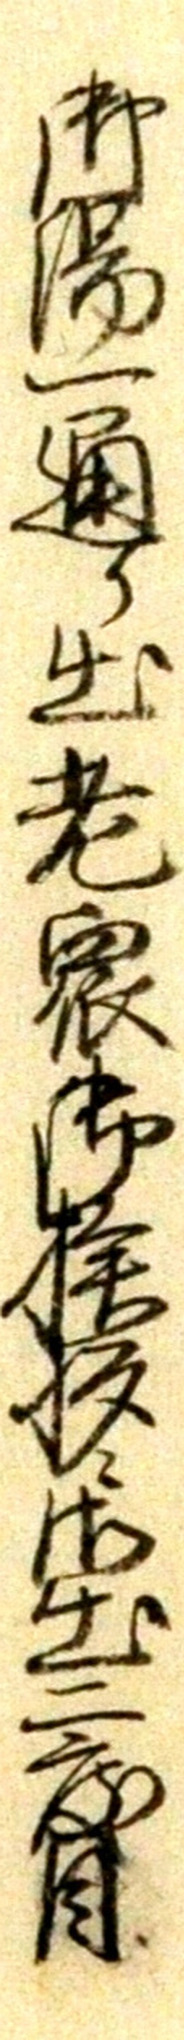御湯一通り出老衆御挨拶ニ御出二度目
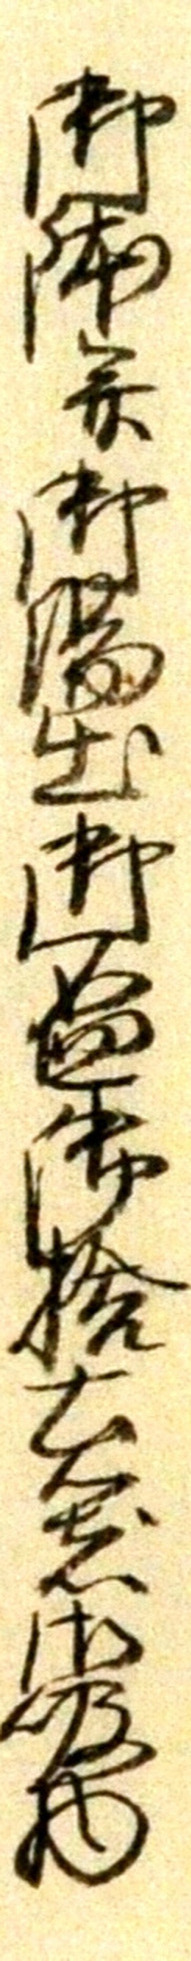御鉢并御湯出御盃御捨土器御吸物
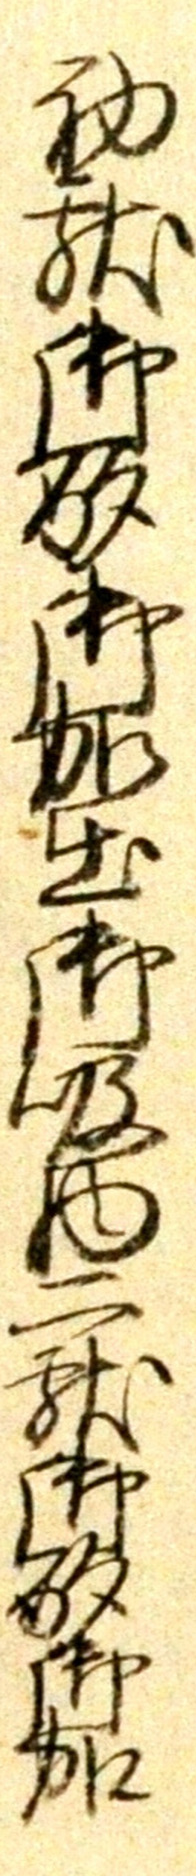初献御酌御加出御吸物二献御酌御加
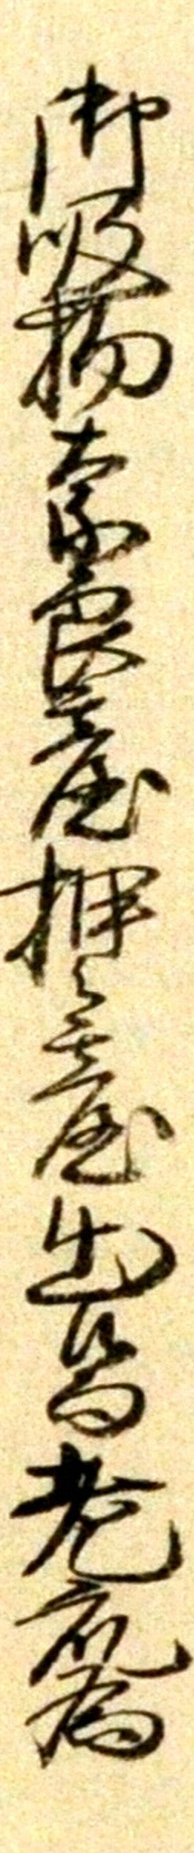御吸物奈良台押之台出候而老衆為
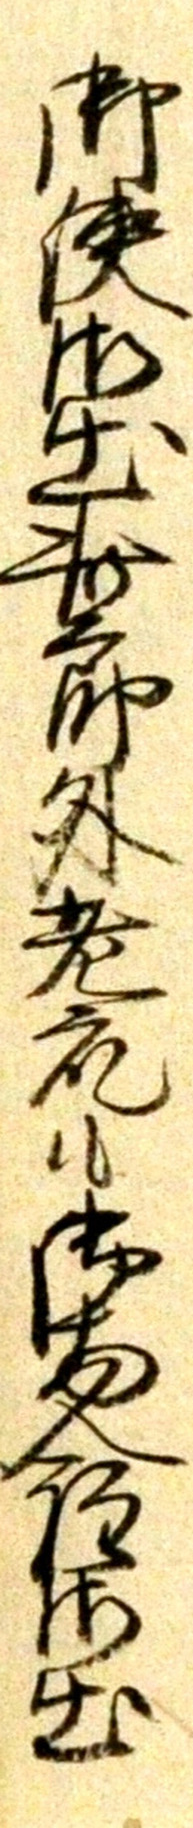御使御出此節外老衆も御両人程御出
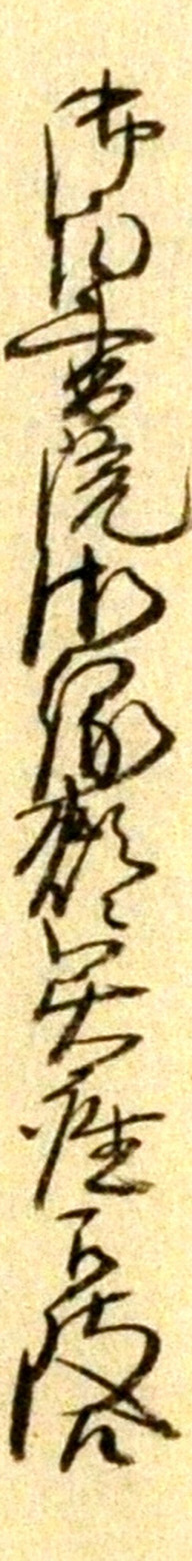御白書院御縁頬ニ着座被致候
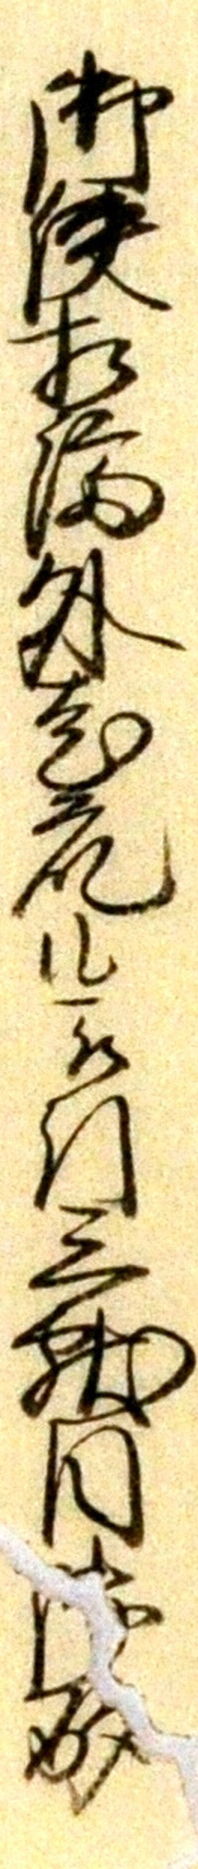御使相済外老衆も被引三献目御酌
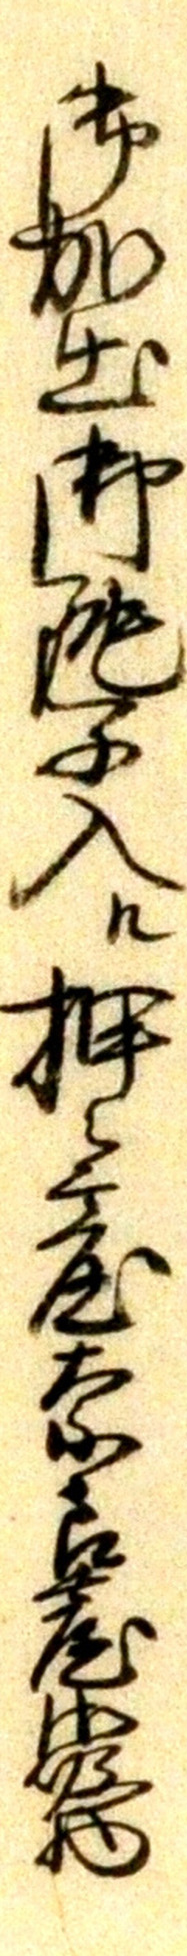御加出御銚子入ル押之台奈良台御吸物
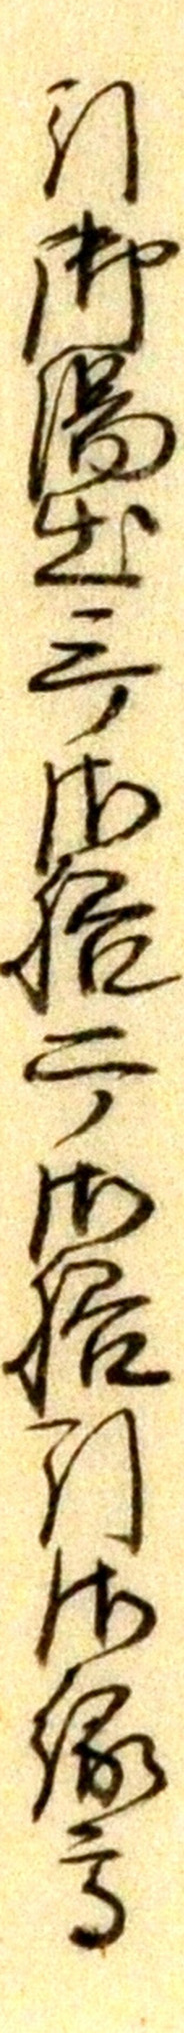引御湯出三ノ御膳二ノ御膳引御縁高
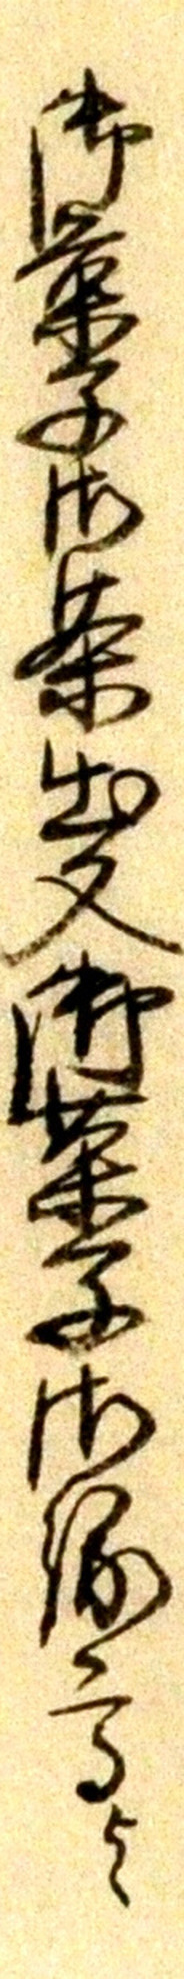御菓子御茶出又御菓子御縁高と
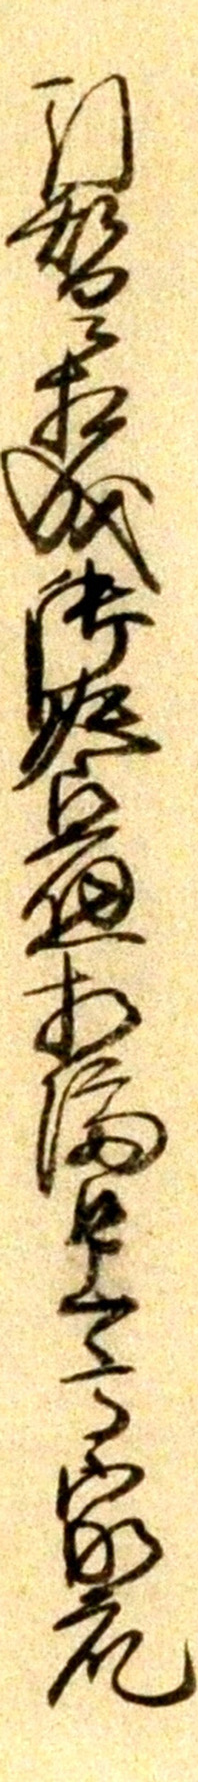引替ニ相成御饗応相済候上高家衆
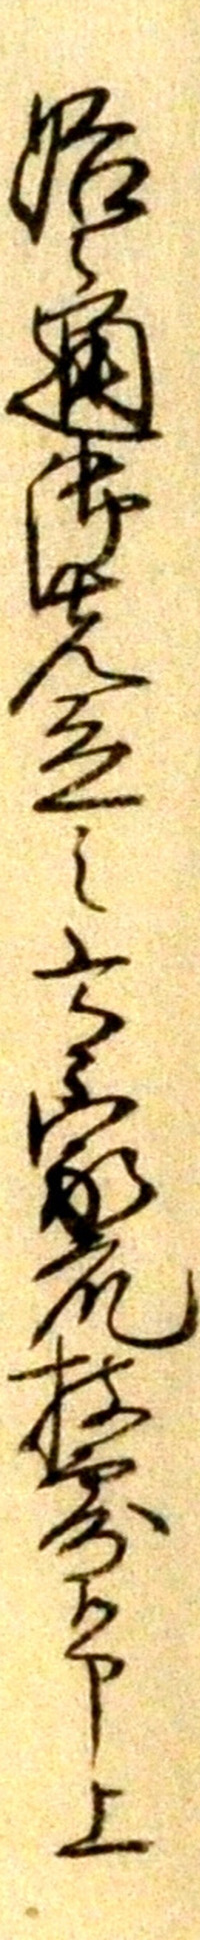始之通御先立之高家衆披露被申上
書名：御移徒相済御祝儀御能ノ節ノ留外
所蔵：伊那市立高遠町図書館・合同会社AMANE
